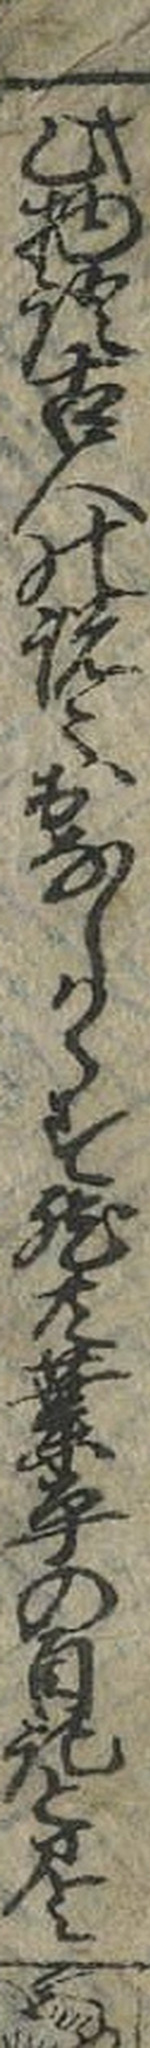此物語古人の説々おなしからす然共業平の自記と見え
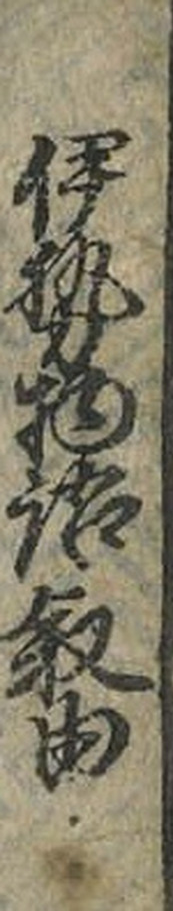伊勢物語叙由
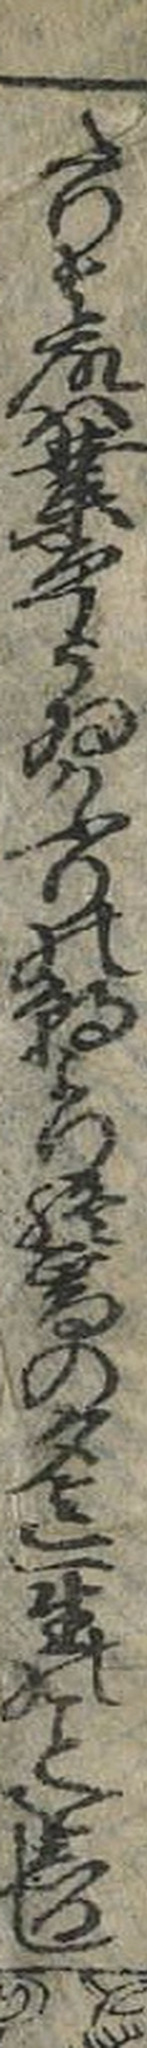たり其故は業平うゐかふりの朝より終焉の夕迄一生のことをしるし
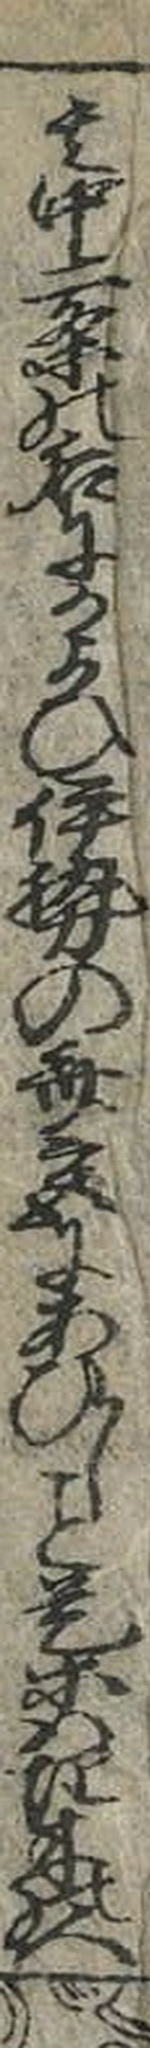其中二条の后にかよひ伊勢の斎宮にあひしこと是等は埋木の人
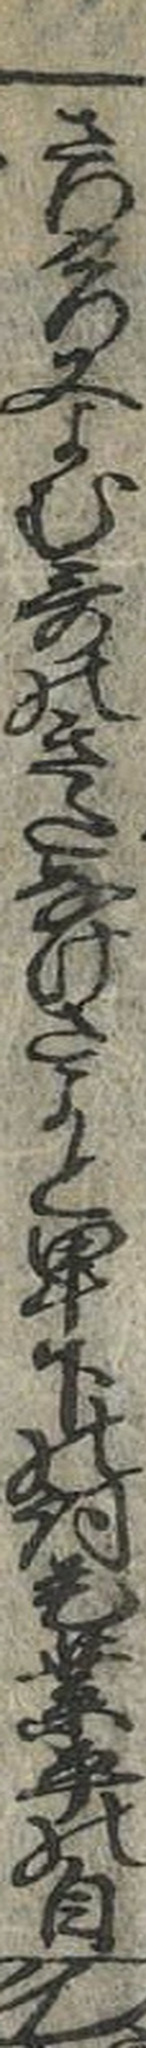さりけり又よむ哥のきたなけさよと卑下の詞是業平の自
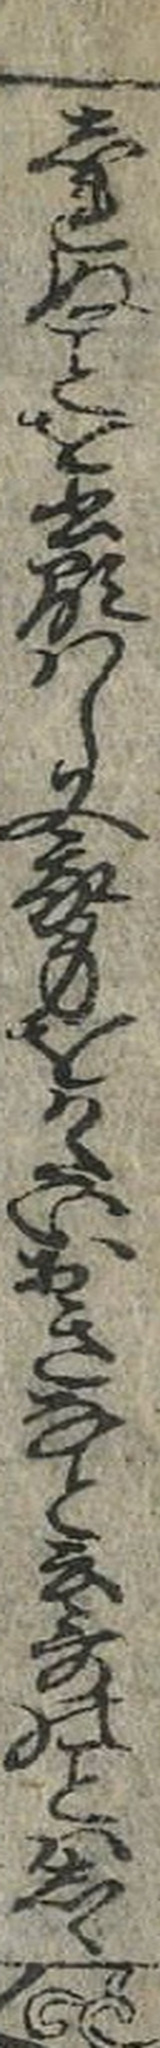しれぬことを書顕はし又我身をかたいおきなと云哥のことはしら
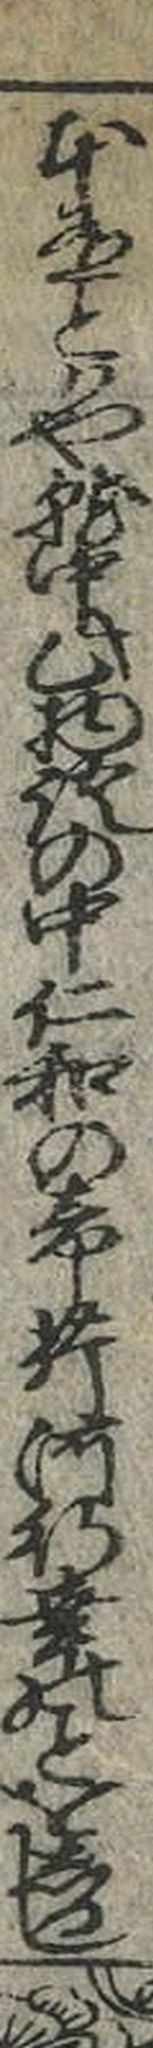本有とかや就中此物語の中仁和の帝芹河行幸のことをしるし
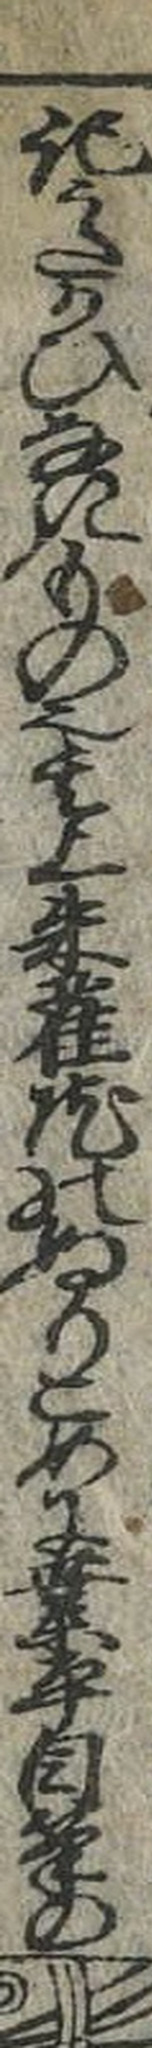記うたかひなきもの也其上朱雀院のぬりこめに業平自筆の
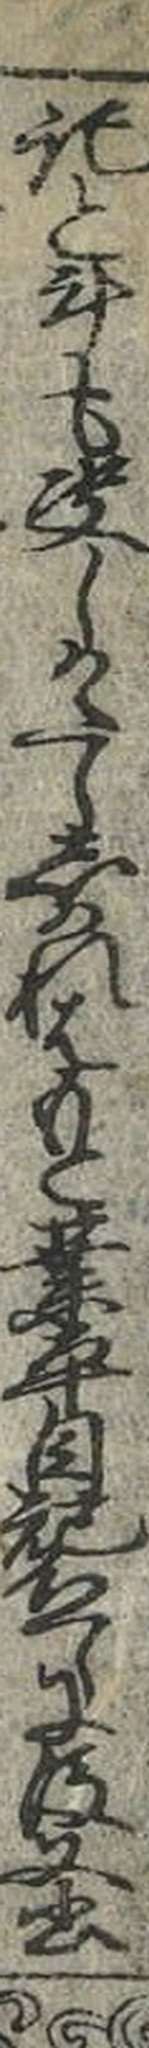記と斗も決しかたししかれはもと業平自記有しに後又書
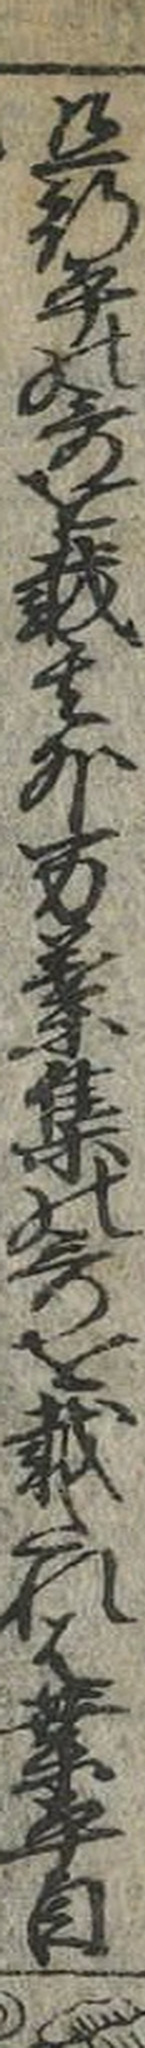旦行平の哥を載其外万葉集の哥を載たれは業平自
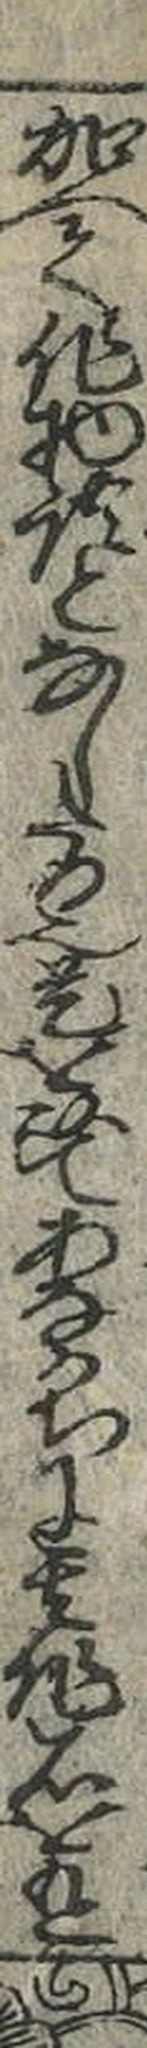加へて作物語となしたる也是を以てあなかちに其作名をもと
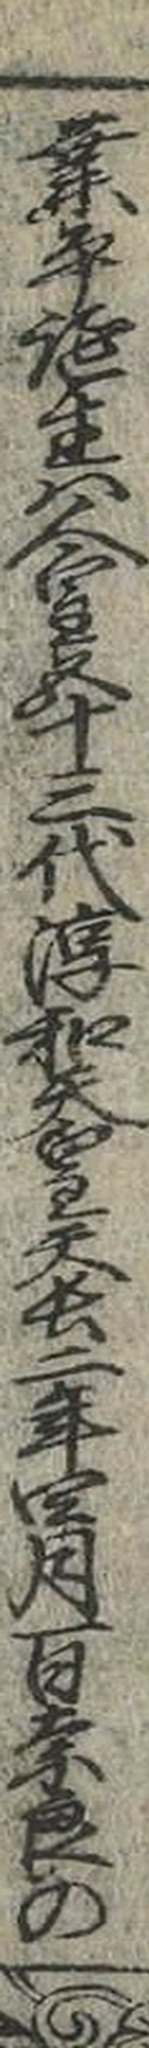業平誕生は人皇五十三代淳和天皇天長二年四月一日奈良の
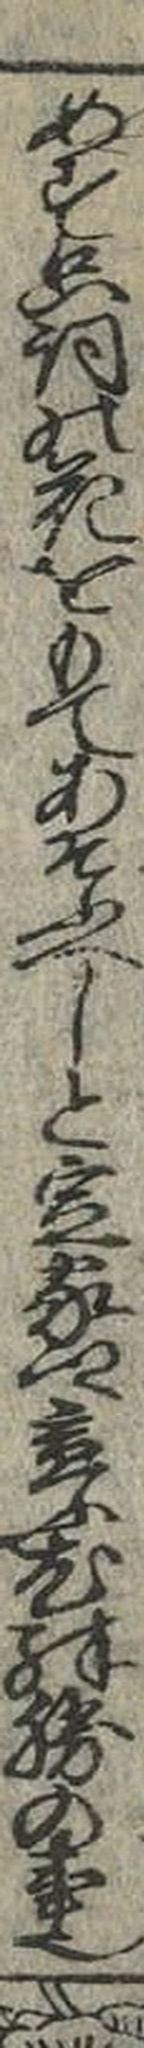めす只詞の花をもてあそふへしと定家卿意ふ尤殊勝の事也
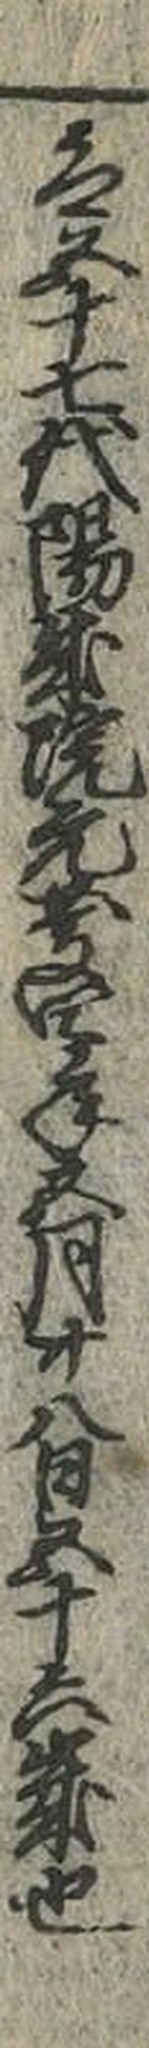は五十七代陽成院元慶四年五月廿八日五十六歳也
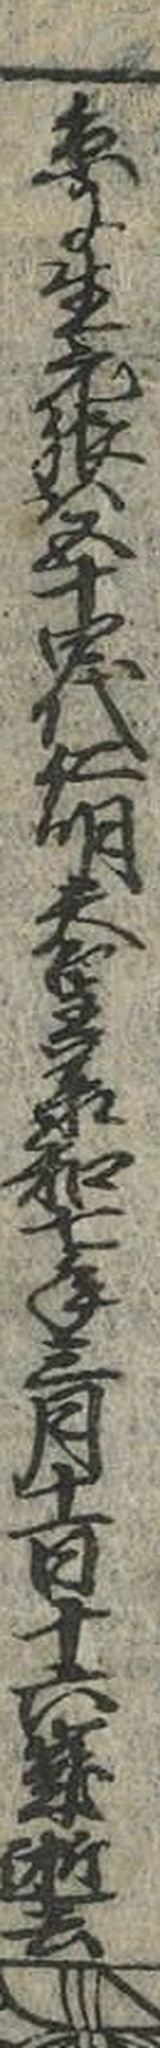京に生元服は五十四代仁明天皇承和七年三月十一日十六歳逝去
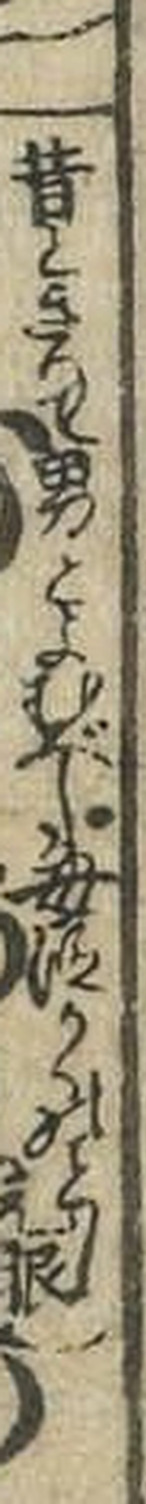昔ときりて男とよむべし。毎段かくのことし
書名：新板絵入伊勢物語 : かうしやく付 2巻 上
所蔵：東京学芸大学教育コンテンツアーカイブ
